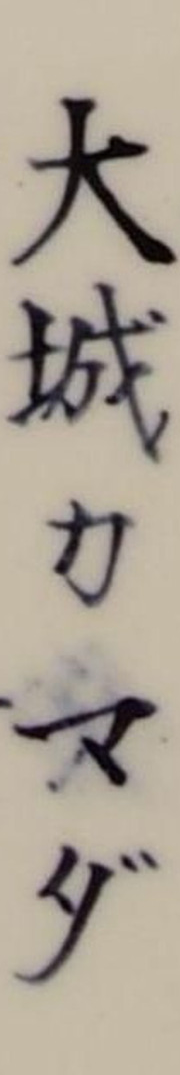大城カマダ
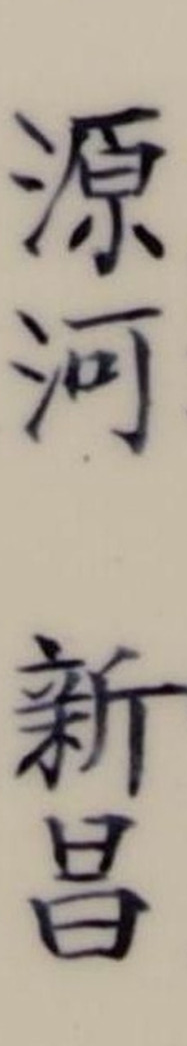源河新昌
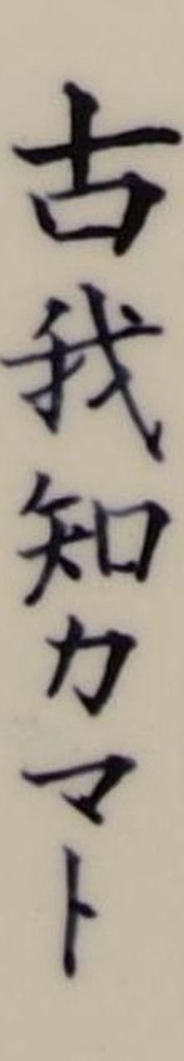古我知カマト
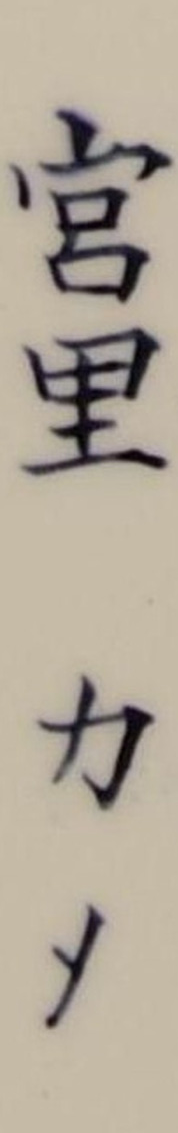宮里カメ
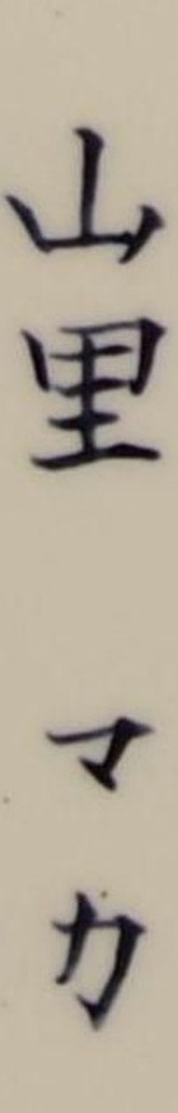山里マカ
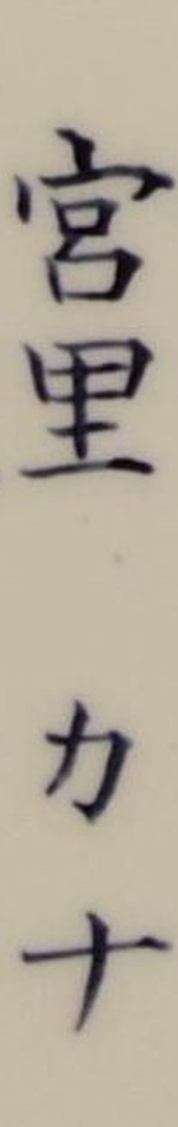宮里カナ
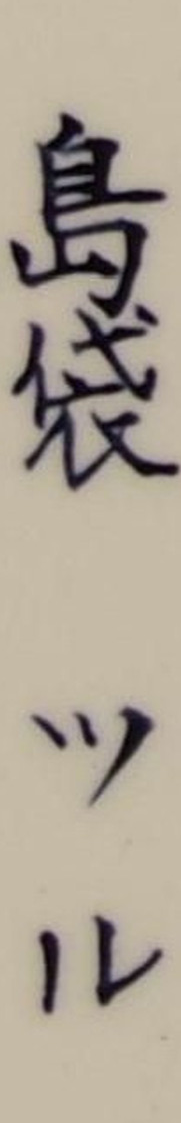島袋ツル
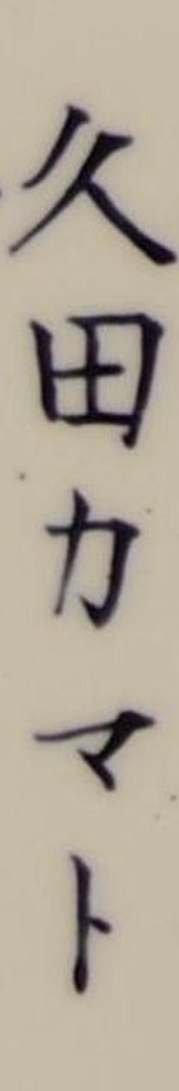久田カマト
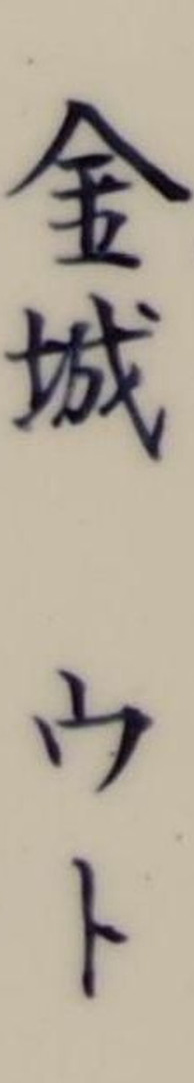金城ウト
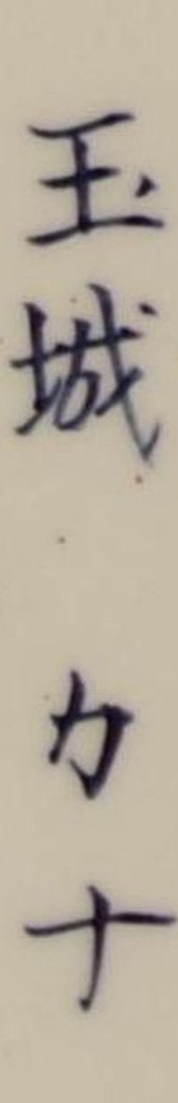玉城カナ
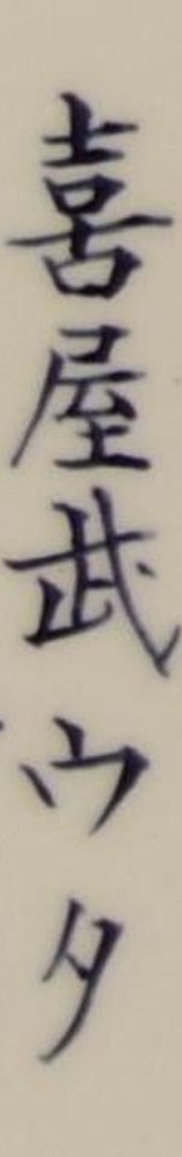喜屋武ウタ
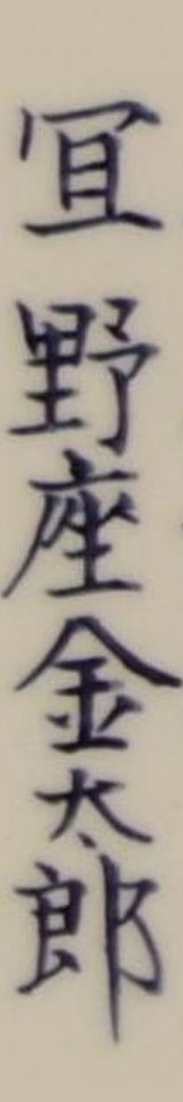宣野座金太郎
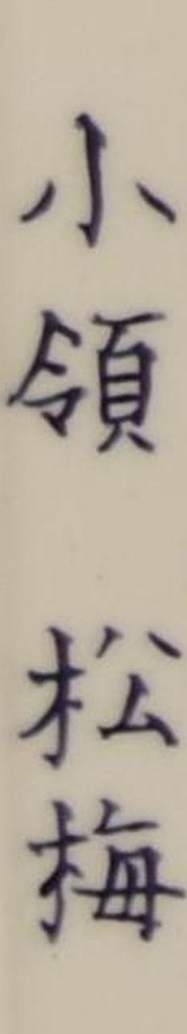小領松梅

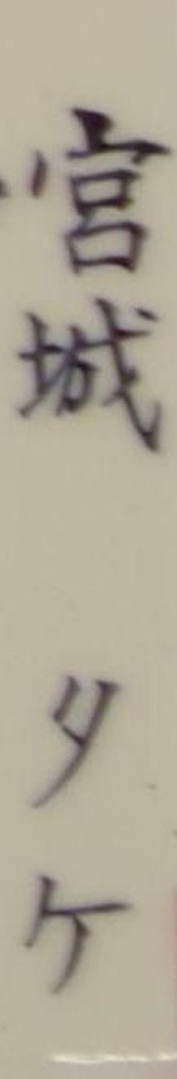宮城タケ
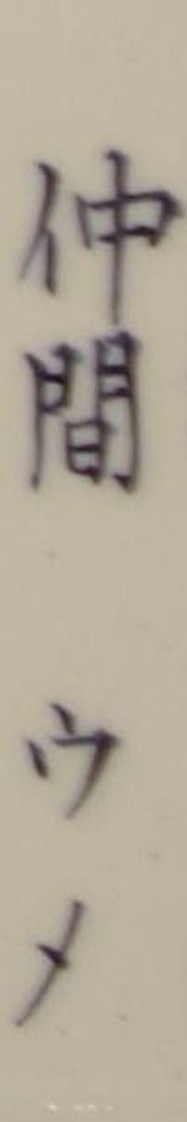仲間ウメ
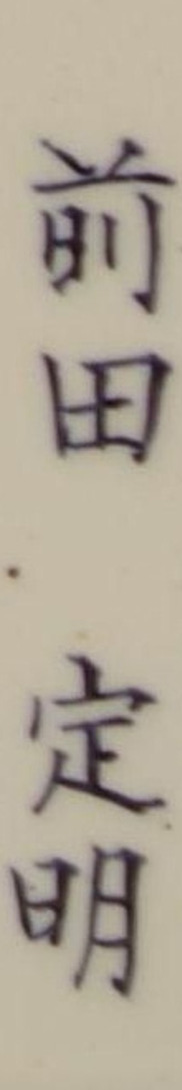前田定明
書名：E~L
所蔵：高野山金剛峯寺
